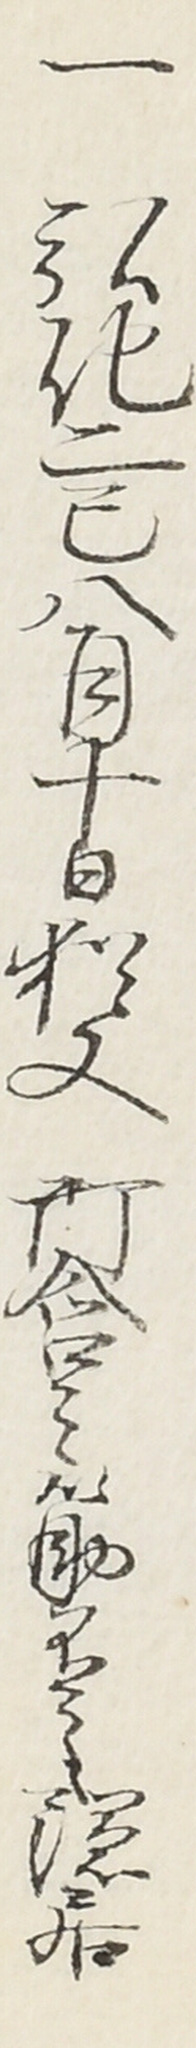一弘化二巳八月十日猶又御含之筋有之隠居
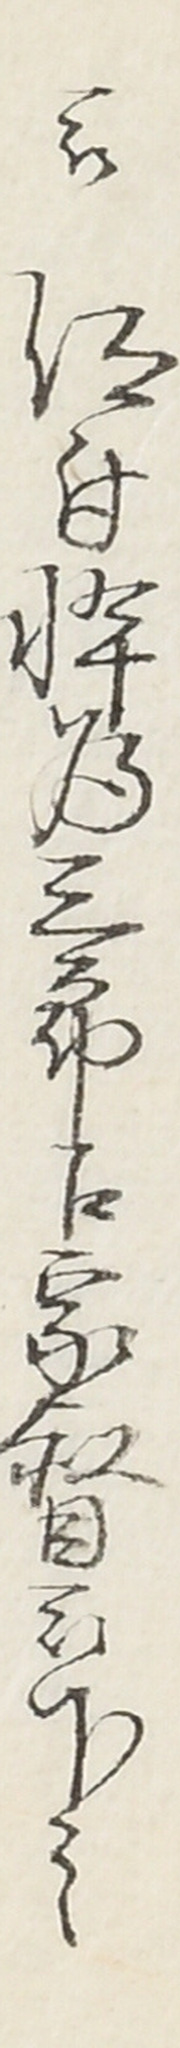被仰付伜為三郎江家督被下之
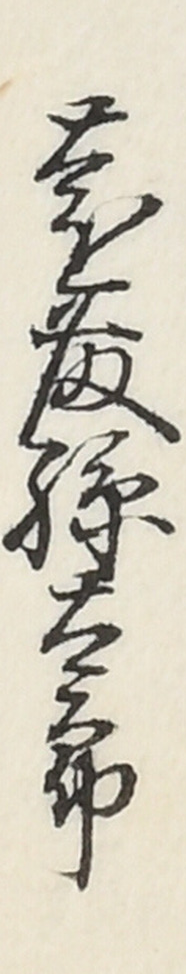遠藤孫太郎
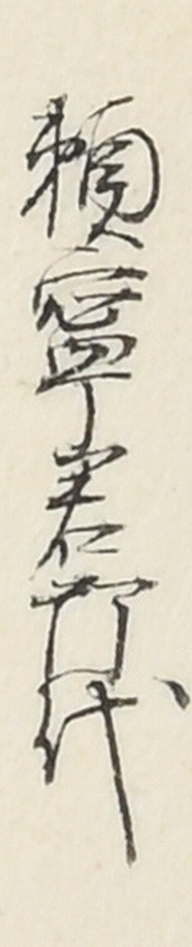頼寧君御代

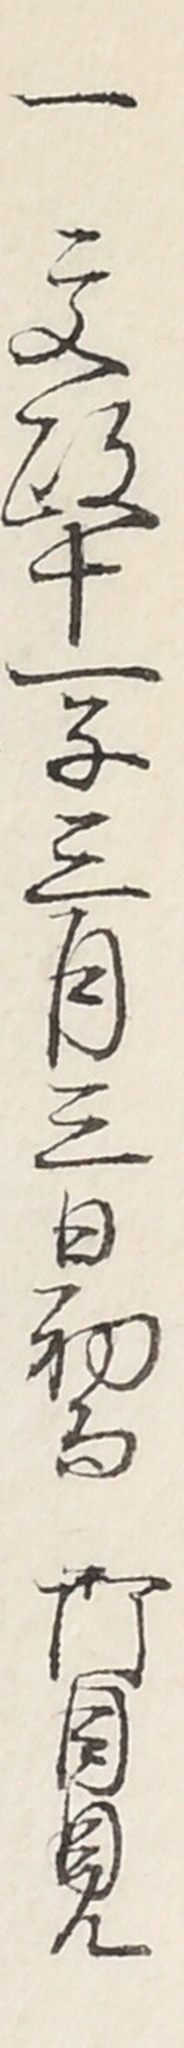一文政十一子三月三日初而御目見
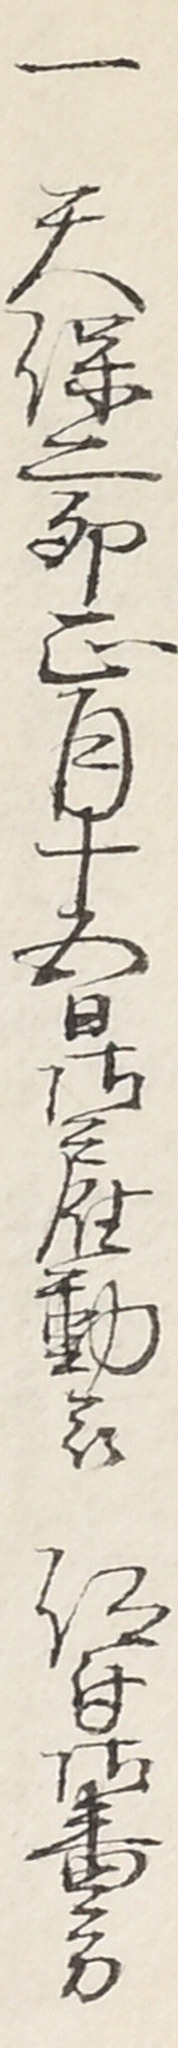一天保二卯正月十五日御雇勤被仰付御番方
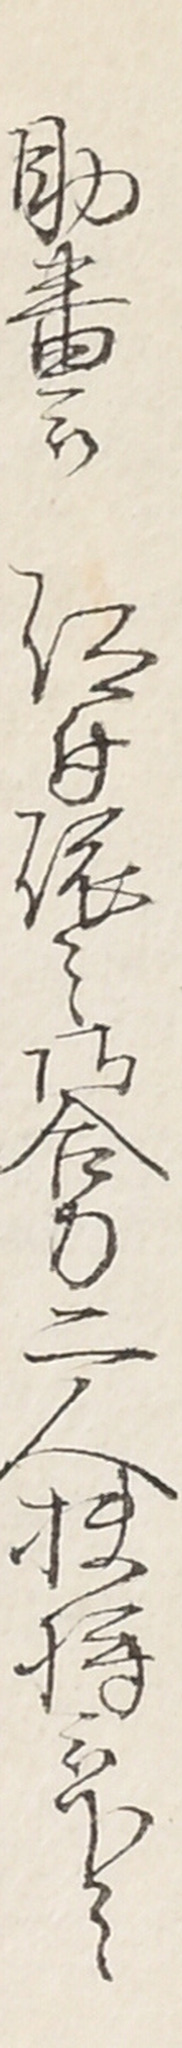助番被仰付依之御合力二人扶持被下之
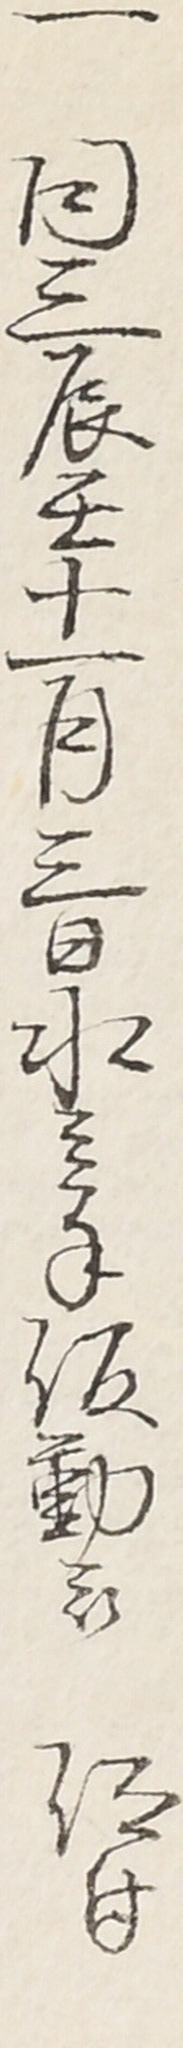一同三辰閏十一月三日水之手仮勤被仰付
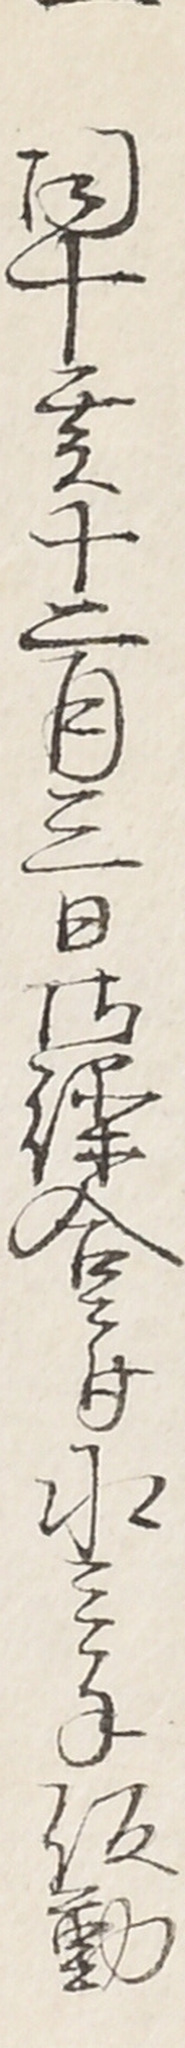一同十亥十二月三日御繰合ニ付水之手仮勤
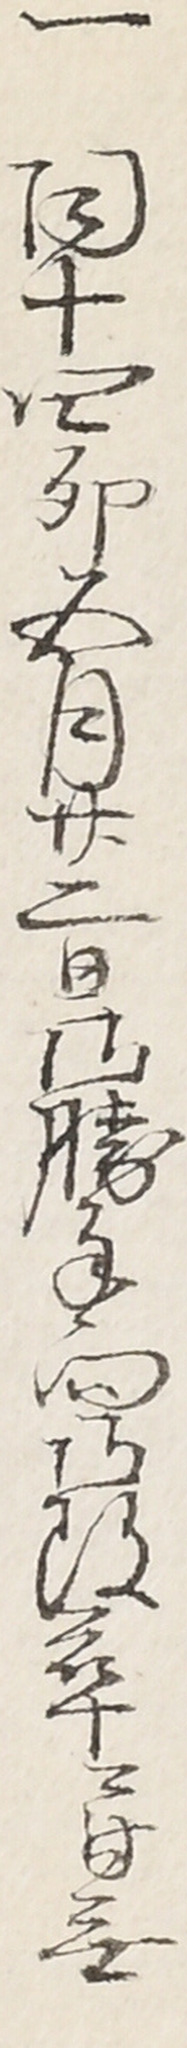一同十四卯五月廿二日御勝手向御改卒ニ付無
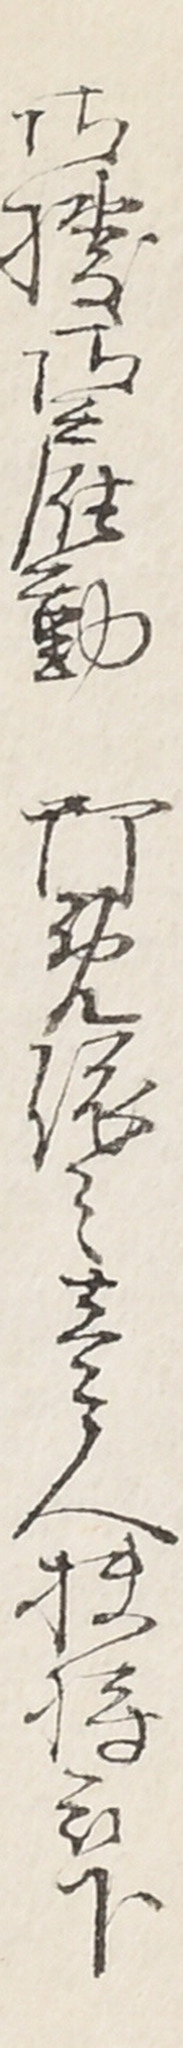御拠御雇勤御免依之壱人扶持被下
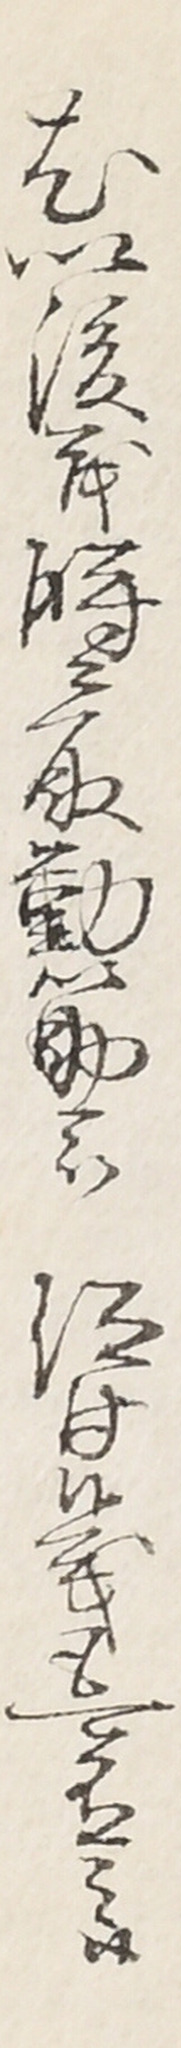尤以後も時ニ取勤筋被仰付候義も可有之候
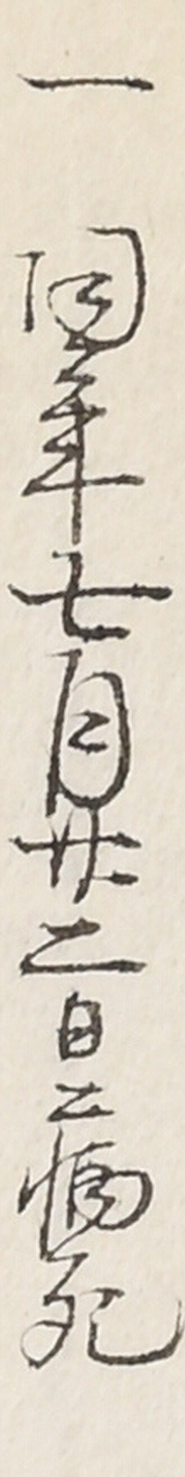一同年七月廿二日病死
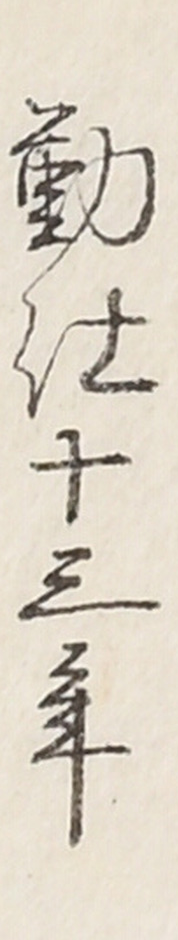勤仕十三年
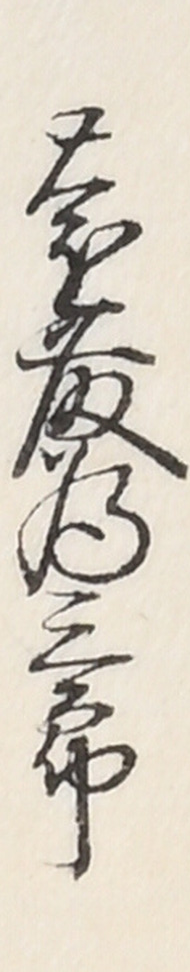遠藤為三郎
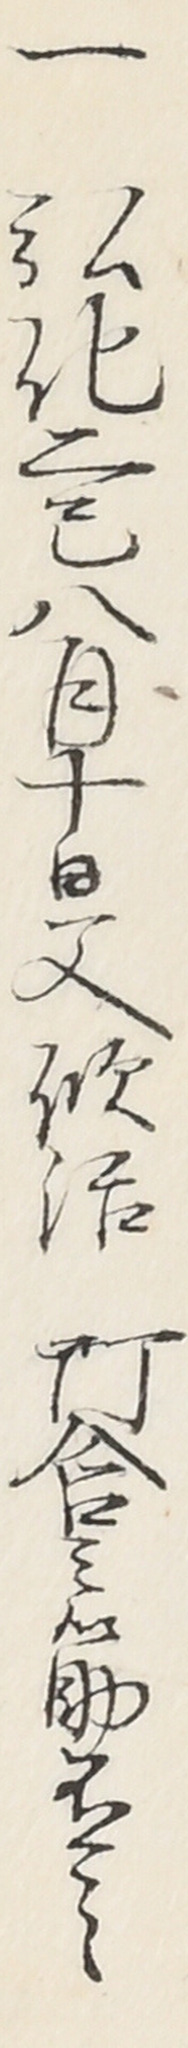一弘化二巳八月十日父欣治御含之筋有之
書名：給人諸士勤仕録（七）
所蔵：伊那市立高遠町図書館・合同会社AMANE
